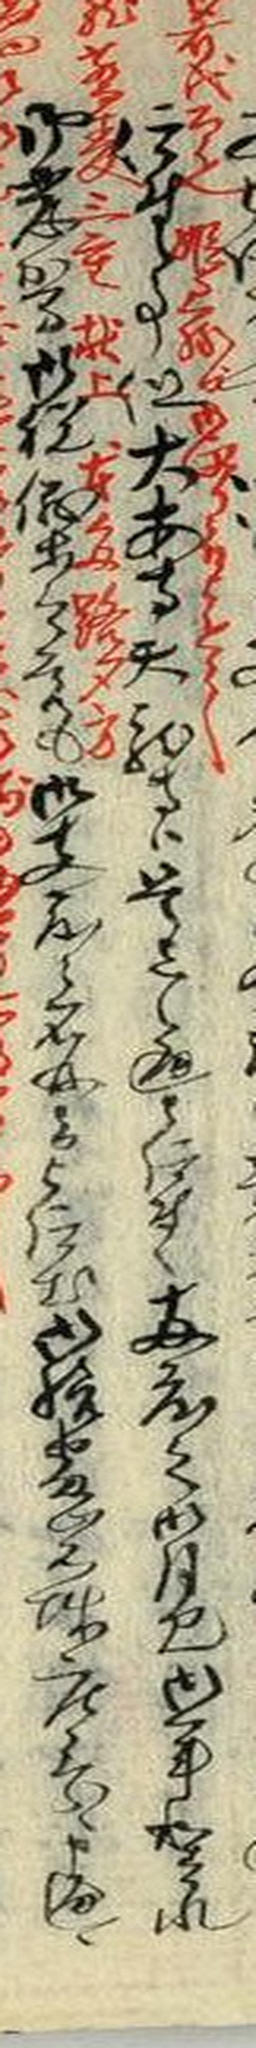御発駕御祝儀等之節も御支度ニ不及旨被仰出御膳番岩城庄三郎へ申通候
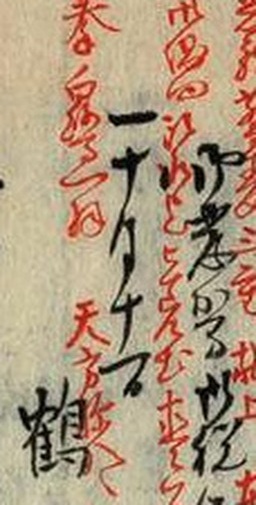一十月十一日
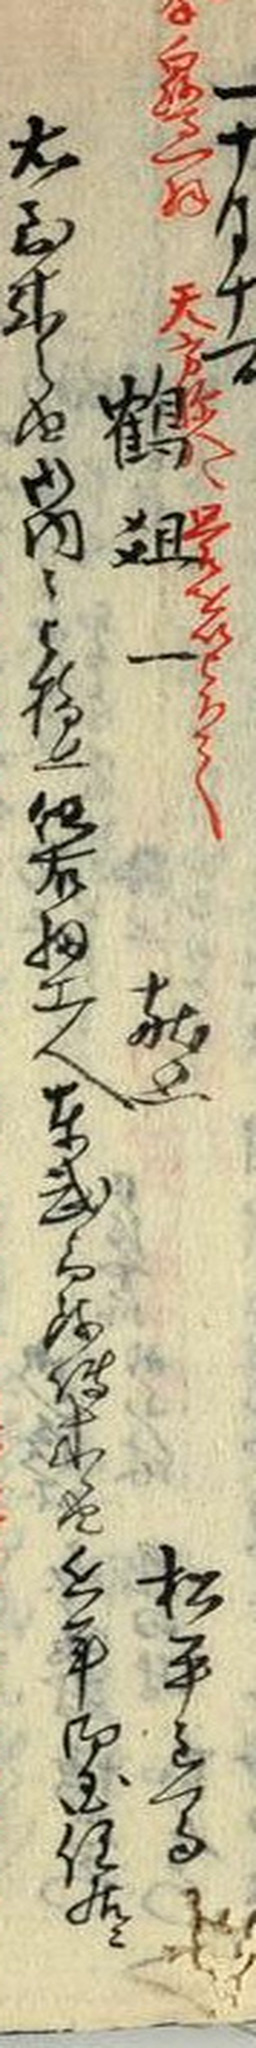右到来之由御内々被指上但右細工人東武ニ而致伝来候由近年御国住居ニ
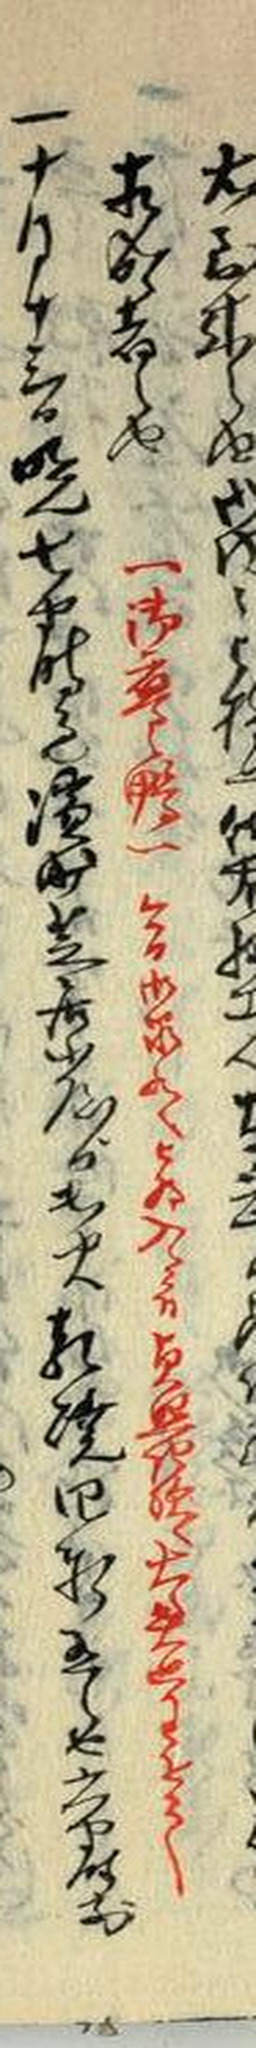一十月十三日暁七半時過浜町芝居小屋ゟ出火類焼四軒有之由六半時前
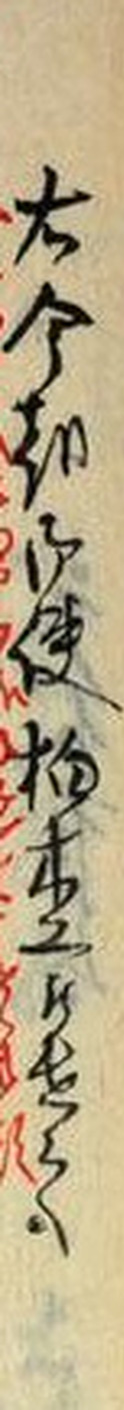右今朝御使狛木工被遣之
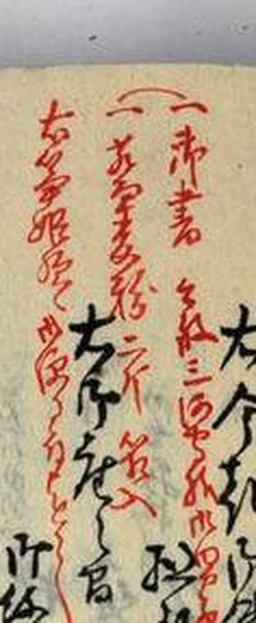一蕎麦粉二斤箱入
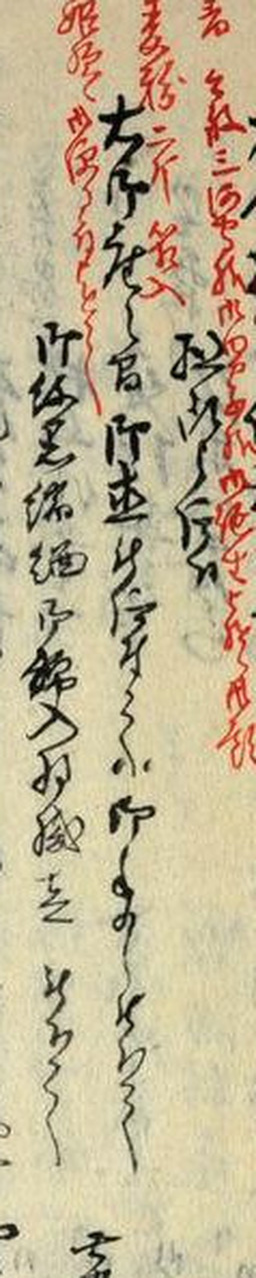右御座之間御直被仰付之御手のし被下之
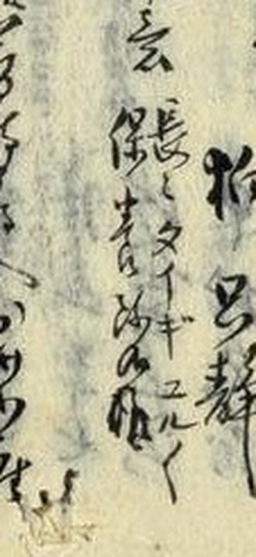保養致候様
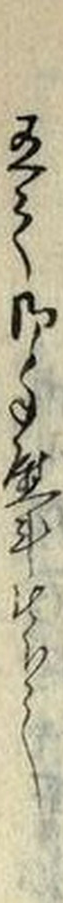有之御手熨斗被下之
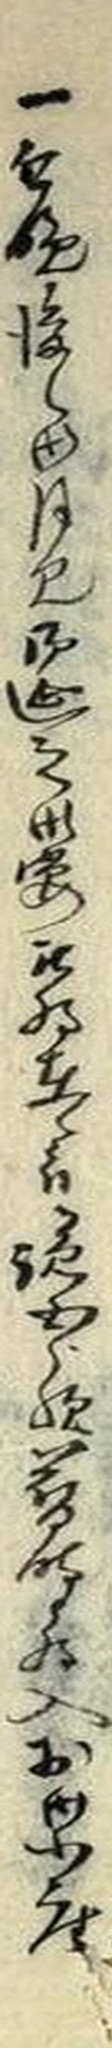一今晩後之御月見御延之御宴被為在候ニ付謙五郎様暮時被為入於御小座
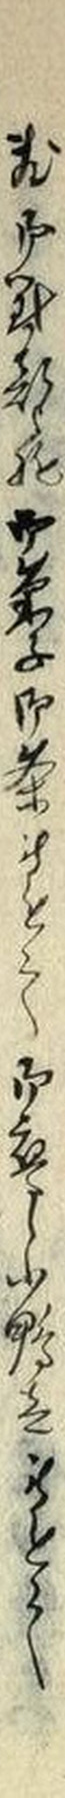敷御対顔被遊御菓子御茶被進之御鷹之小鴨壱被進之
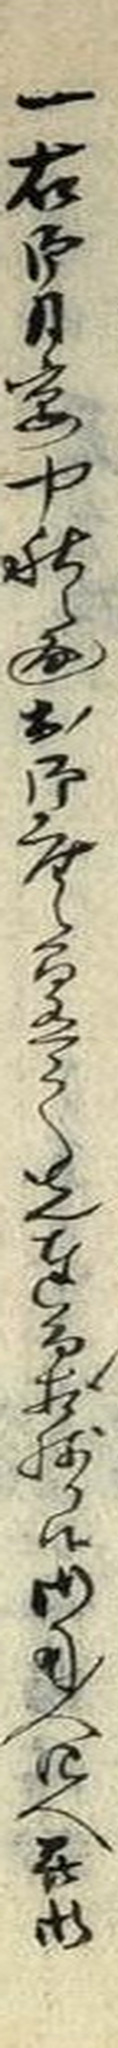一右御月宴中秋之通於御座之間有之先達而相残り候御用人四人幷御
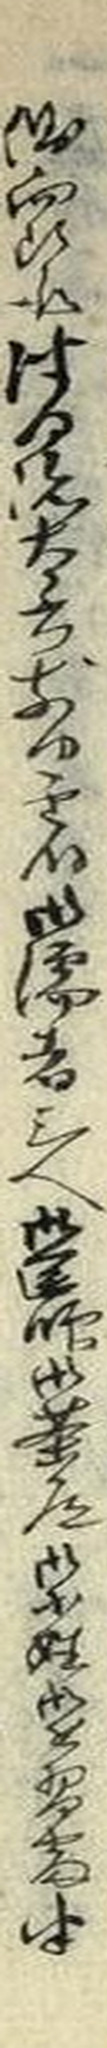側向頭取津田弥太六前田雲洞御儒者三人御医師御茶道御小姓御近習番半
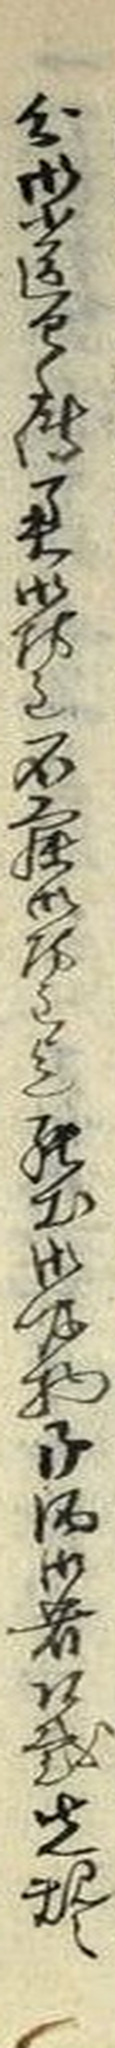分御小道具手伝奥御坊主不寝御坊主迄罷出御吸物御酒御肴頂戴先規之
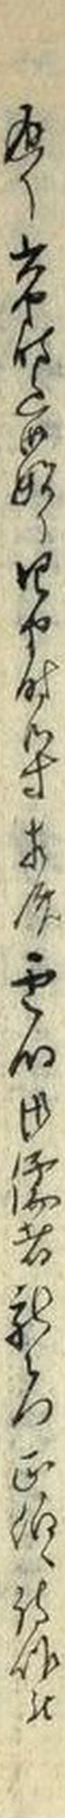通り六半時過御始り四半時弐寸相済雲洞御儒者新右衛門正伯へ詩作被
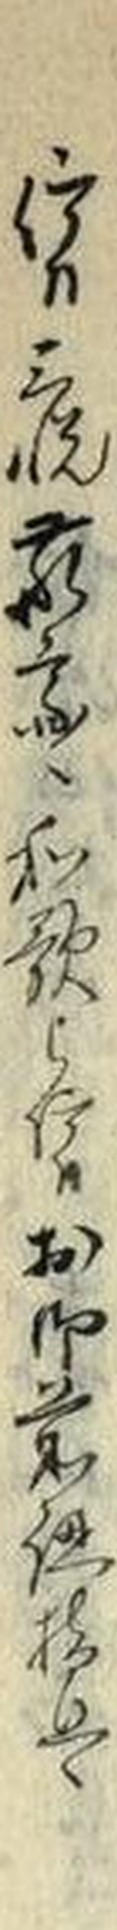仰付三悦恭斎へ和歌被仰付於御前認指上候
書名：少傅日録抄（斉承付側向頭取日記、在国）
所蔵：福井県文書館 Fukui Prefectural Archives
